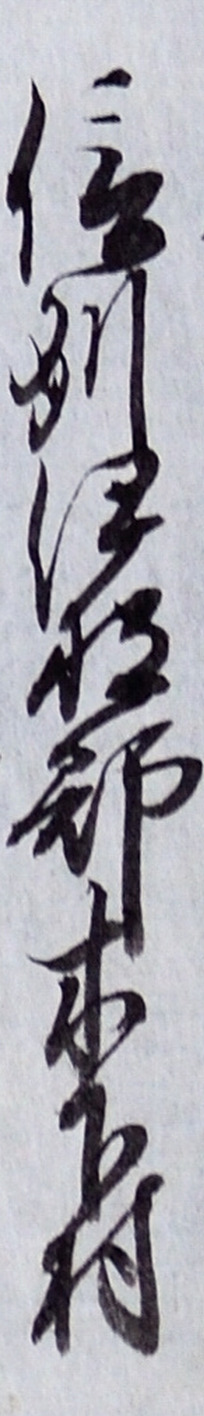信州伊那郡木下村
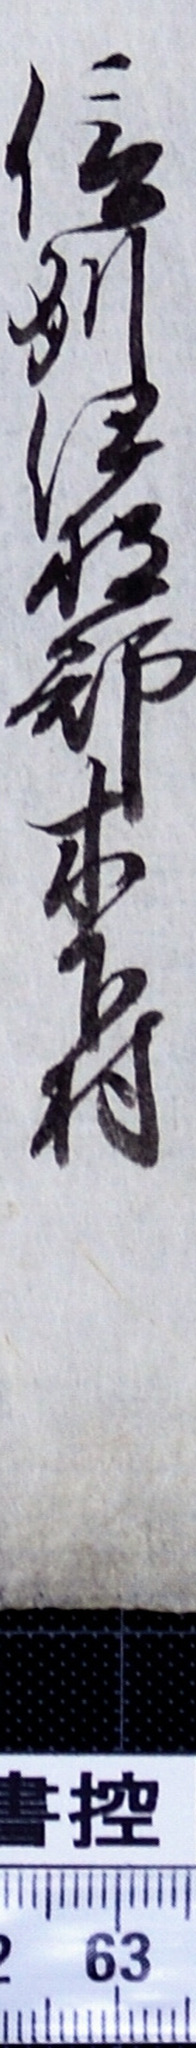信州伊那郡木下村
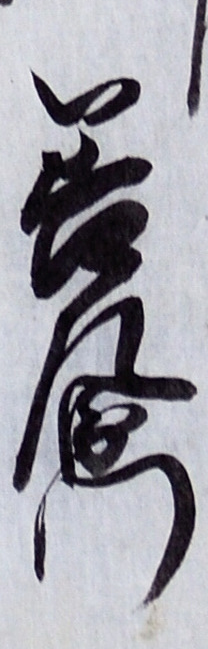善左衛門
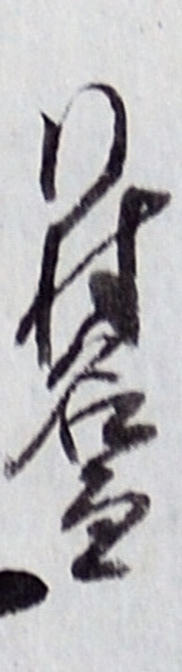同村名主
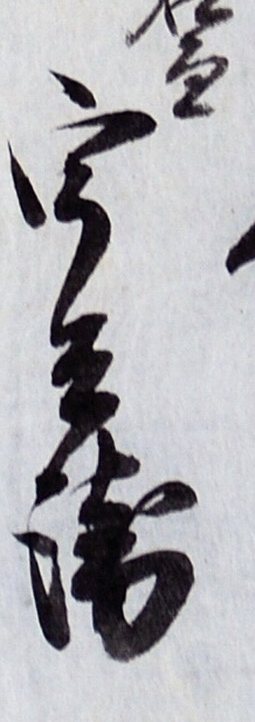宇兵衛
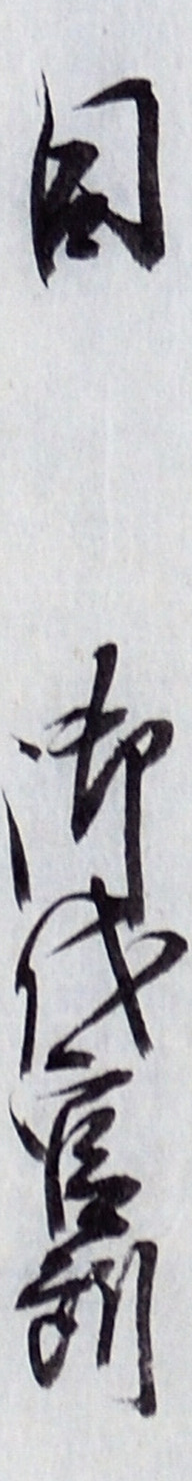同御代官所
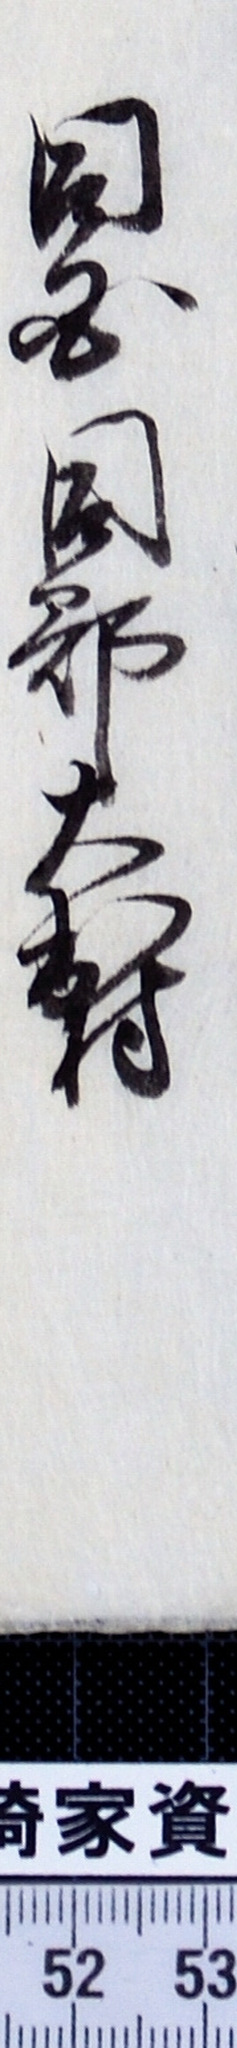同国同郡大出村
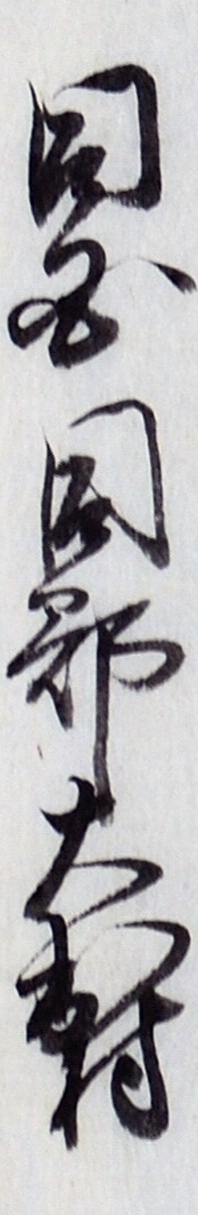同国同郡大出村
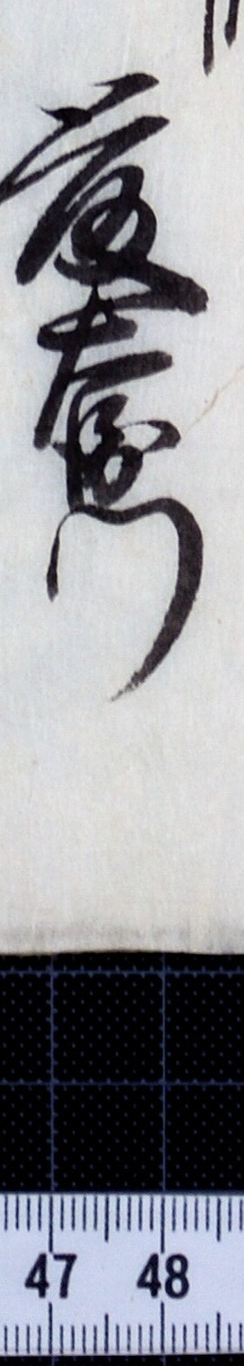藤右衛門
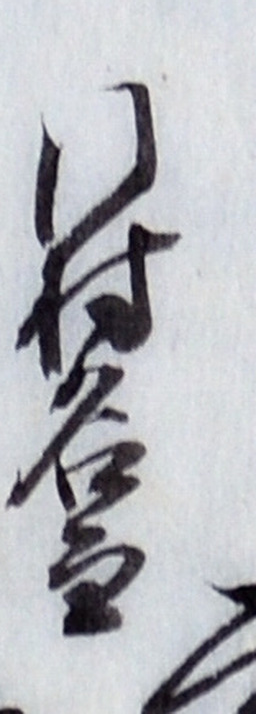同村名主
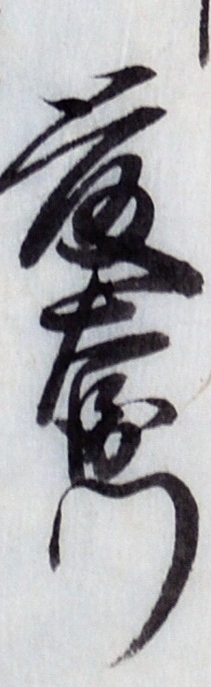藤右衛門
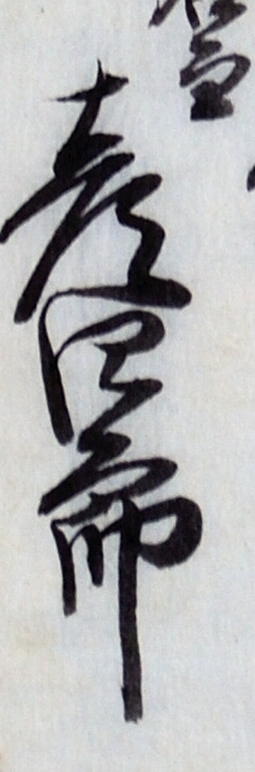彦四郎
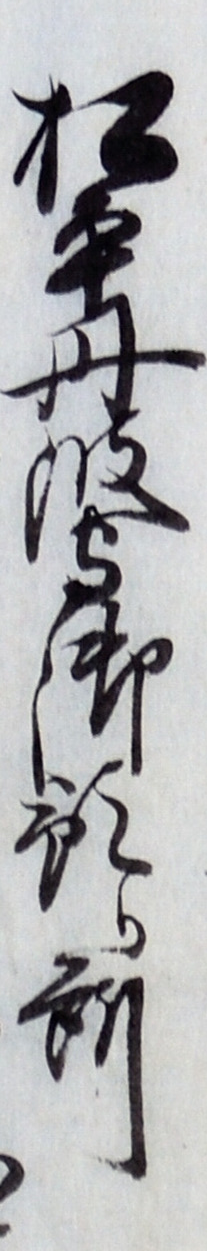松平丹波守御預り所
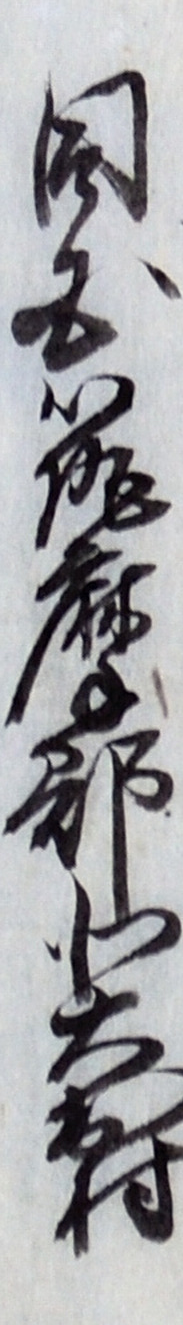同国筑摩郡北大出村
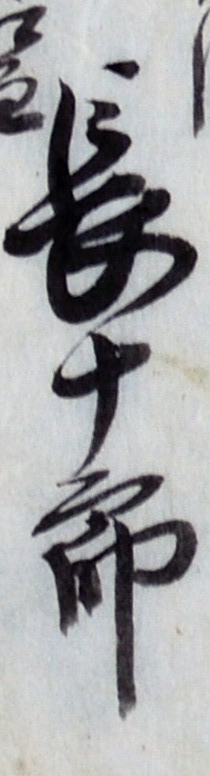長十郎
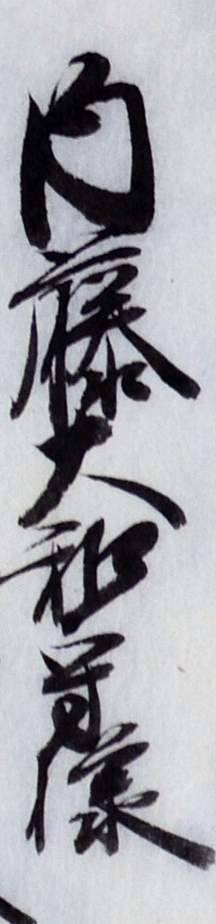内藤大和守様
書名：御持山御払掟書願書控
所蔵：伊那市立高遠町図書館・合同会社AMANE
